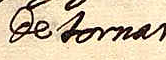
de tornar
